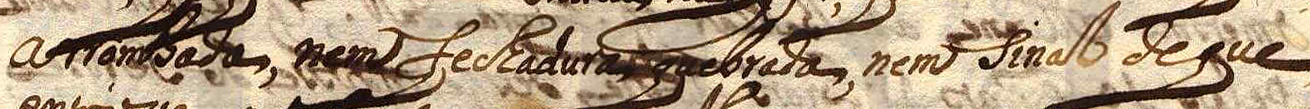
arrombada, nem fechadura quebrada, nem sinal de que
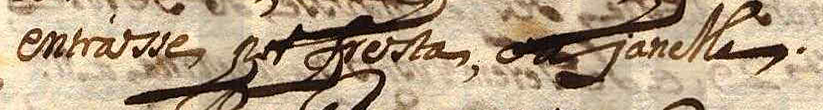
entrasse por fresta, ou janella.
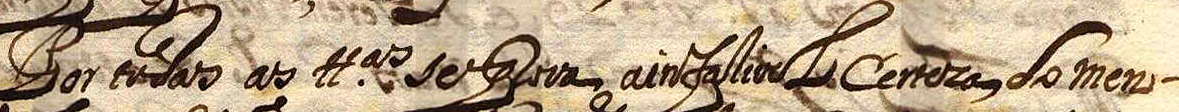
Por todas as tt.as se pRova a infaliveL certeza do men
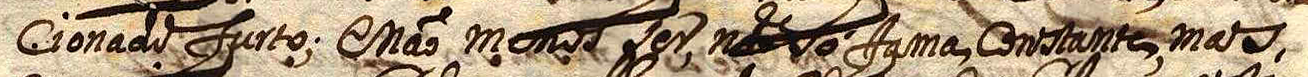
cionado furto; e não menos ser, naõ só fama, constante, mas,
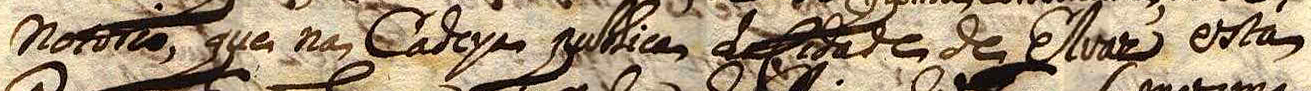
notorio, que na Cadeya publica da Cidade de Elvaz esta
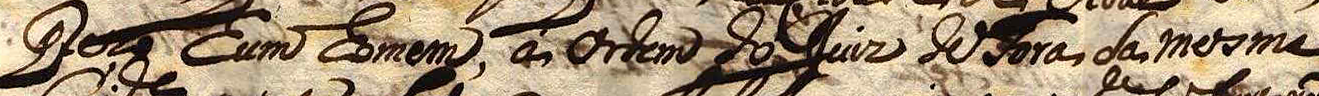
pRezo hum homem, á Ordem do Juiz de Fora da mesma
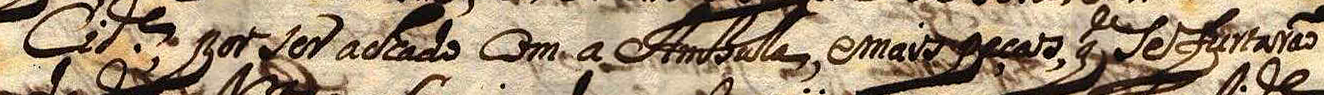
Cid.e por ser achado com a Ambula, e mais peças, q̄ se furtarão
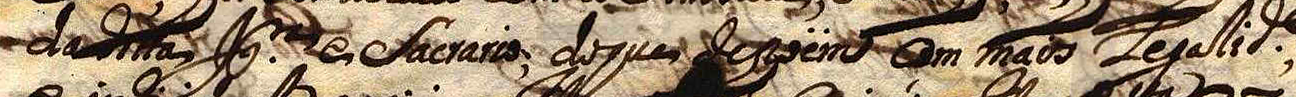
da ditta Jg.ra e Sacrario, do que depoem com mais Legalid.e,
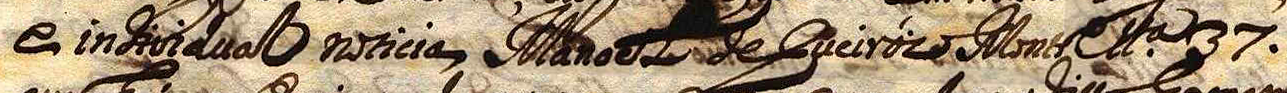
e individual noticia ManoeL de Queiróz Montro tt.a 37.
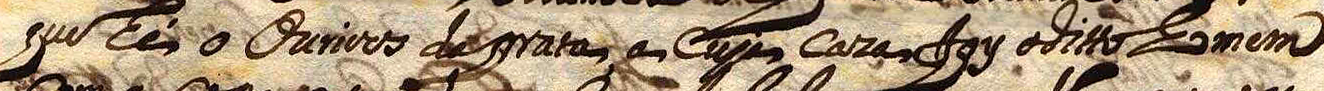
que hé o Ourives de prata a Cuja caza foy o ditto homem
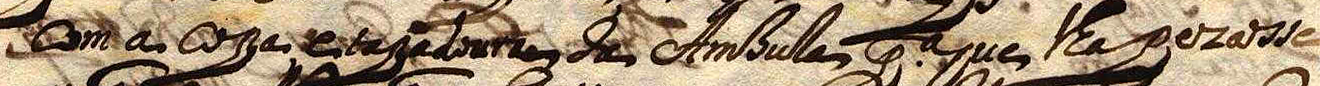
com a copa e tapadoura da Ambula p.a que lhe pezasse,
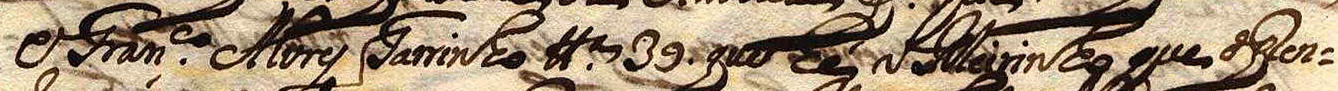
e Fran.co Alvres Tarrinho tt.a 39. que hé o Meirinho que o Ren
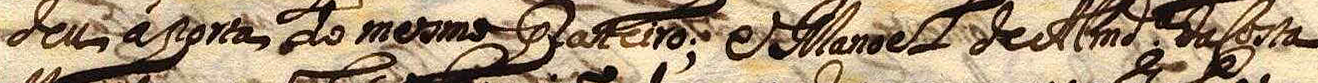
deu á porta do mesmo pRateiro; e ManoeL de Almd.a da Costa
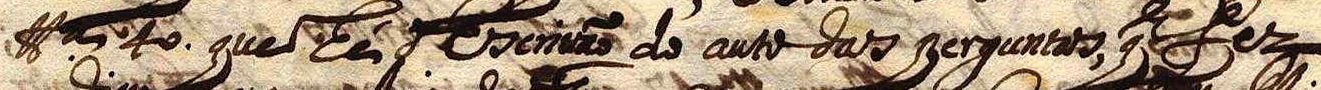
tt.a 40. que hé Escrivão do auto das perguntas, q̄ fez
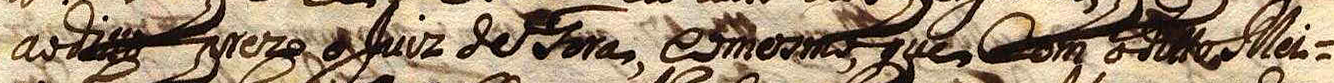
ao ditto prezo o Juiz de Fora, e o mesmo, que Com o ditto Mei
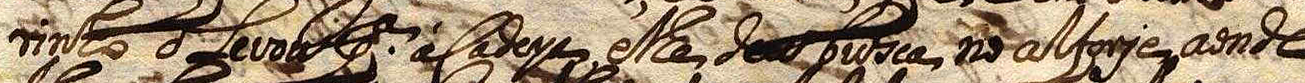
rinho o Levou p.a á Cadeya, e lhe deo busca no alforje, aonde
